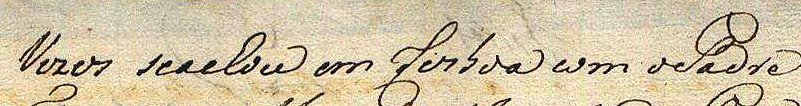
Vezes se achou em Lisboa com o Padre
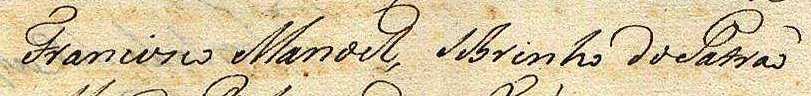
Francisco Manoel, sobrinho do Patraõ
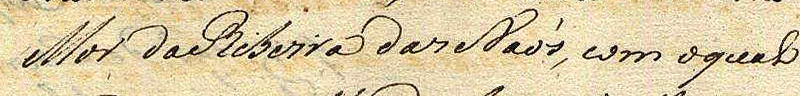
Mor da Ribeira das Naós, com o qual
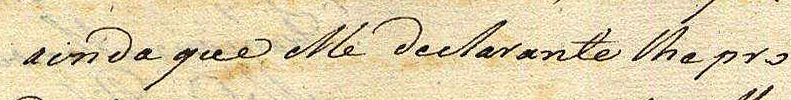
ainda que elle declarante lhe pro
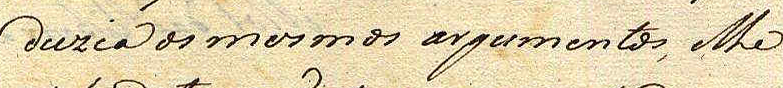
duzia os mesmos argumentos, e lhe
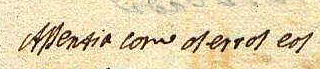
Assentia com os erros e os
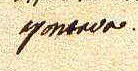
apontava.
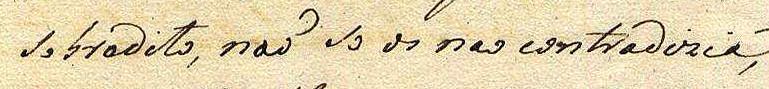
sobredito, naõ só os nao contradizia,
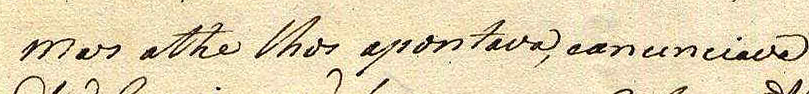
mas athe lhos apontava, e anunciava
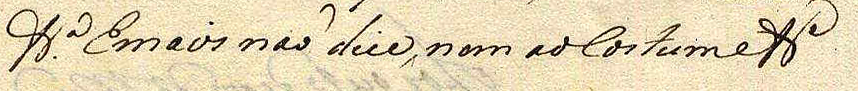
&r.a E mais naõ dice, nem ao Costume &ra
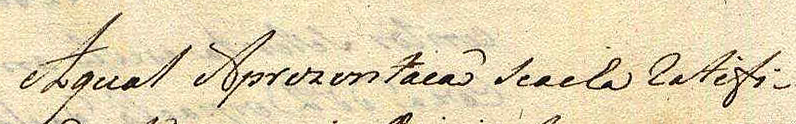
A qual Aprezentaçaõ se acha Ratifi
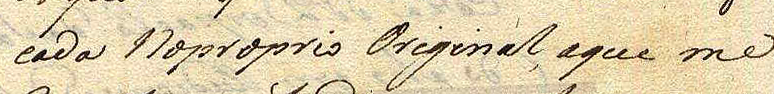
cada No proprio Original, a que me
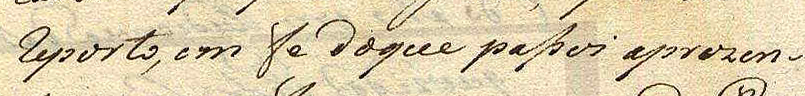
Reporto, em fe do que passei a prezen
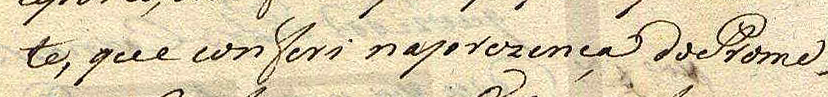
te, que conferi na prezença do Prome
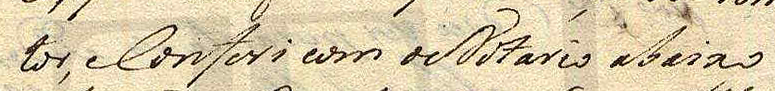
tor, e Conferi com o Notario abaixo
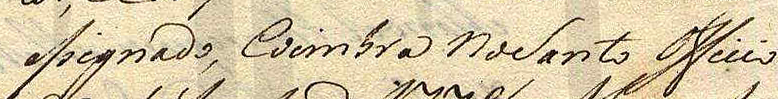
assignado, Coimbra no Santo Officio
